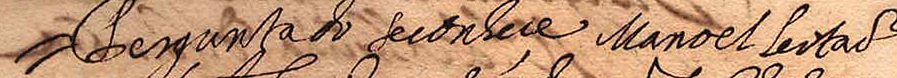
Perguntado se conhece Manoel Leitaõ
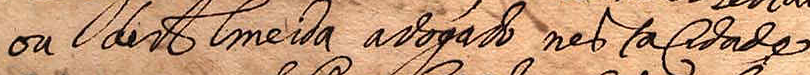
ou de Almeida avogado nesta Cidade
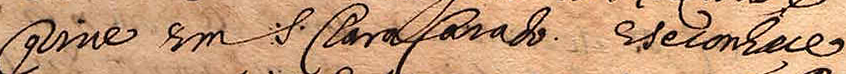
q̄ uiue Em S. Clara Cazado E se conhece
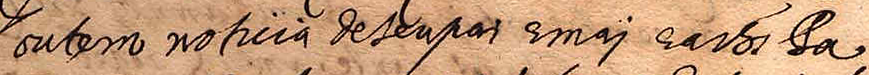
ou tem noticia de seu pai E maj E avos Pa
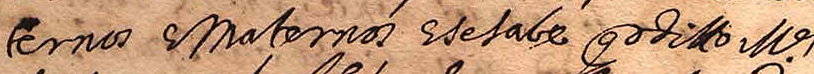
ternos E Maternos, E se sabe q̄ o ditto M.el
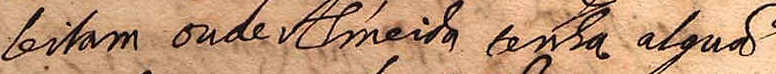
leitam ou de Almeida tenha alguā
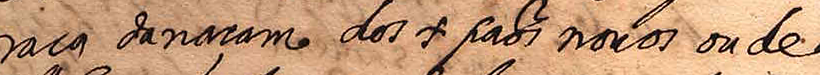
raça da naçam dos xpaõs nouos ou de
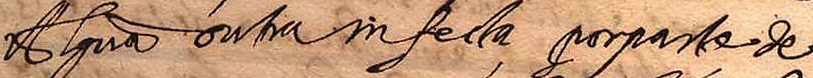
Alguā outra infecta, por parte de
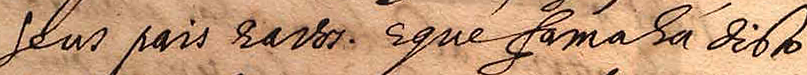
seus pais E avos. E que fama há disto
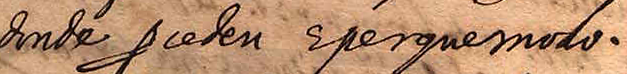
donde ꝓcedeu E per que modo.
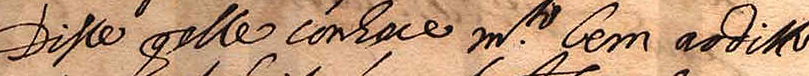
Disse q̄ elle conhece m.to bem ao ditto
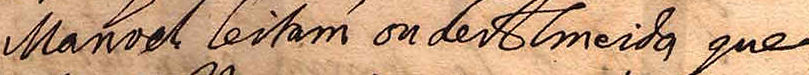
Manoel leitam ou de Almeida que
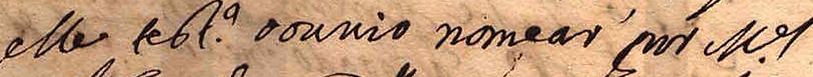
elle test.a o ouuio nomear por M.el
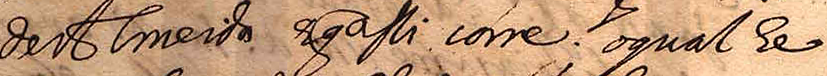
de Almeida E q̄ assi corre, o qual he
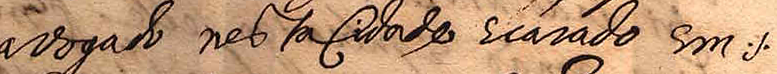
avogado nesta Cidade E cazado Em S.
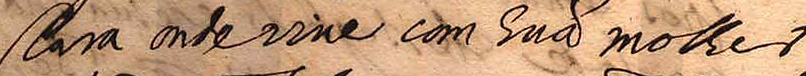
Clara onde viue com huā molher
